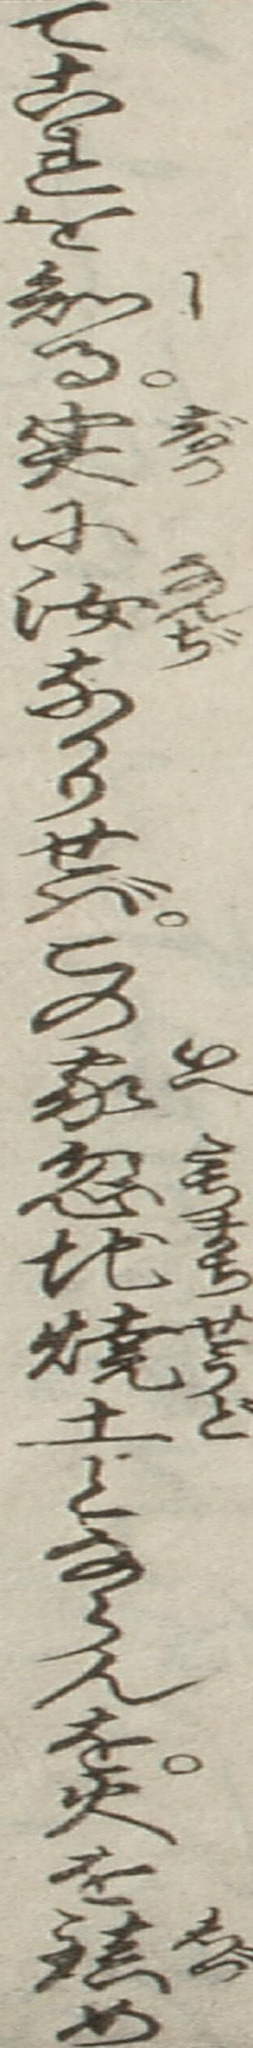てこれを知る。実に汝なかりせば。この家忽地焼土とならんを。火を鎮め
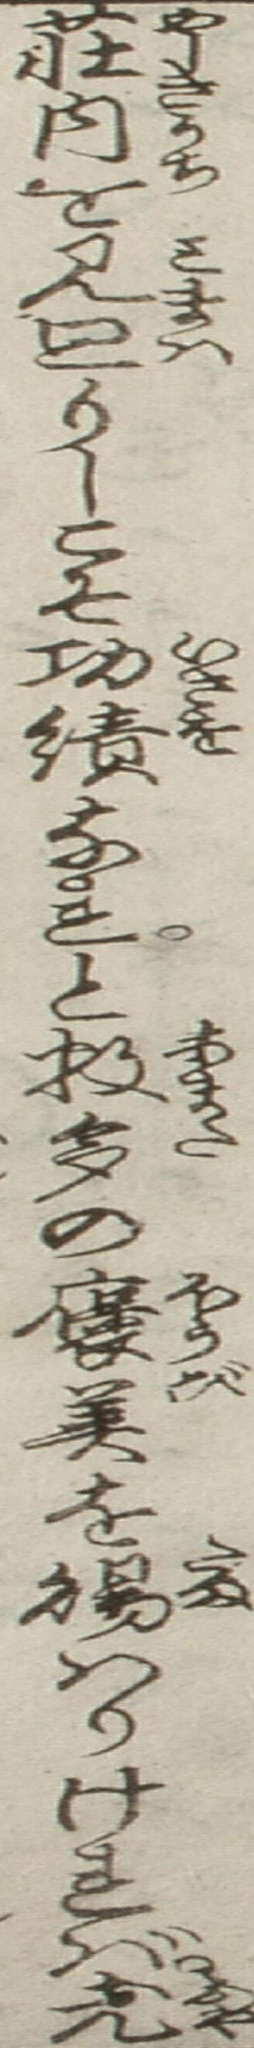荘内を見廻りしこそ功績なれ。と投多の褒美を賜はりければ。老
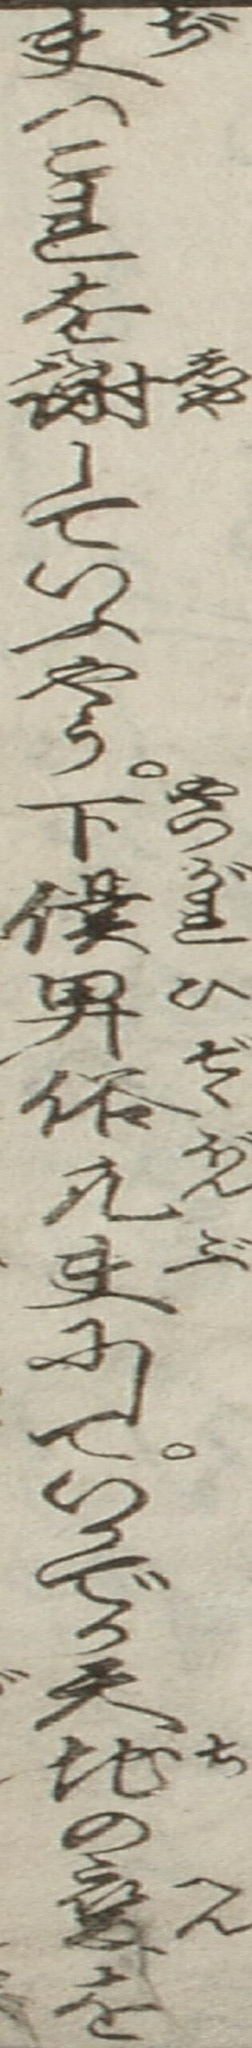夫はこれを謝していふやう。下僕卑俗凡夫にして。いかでか天地の変を
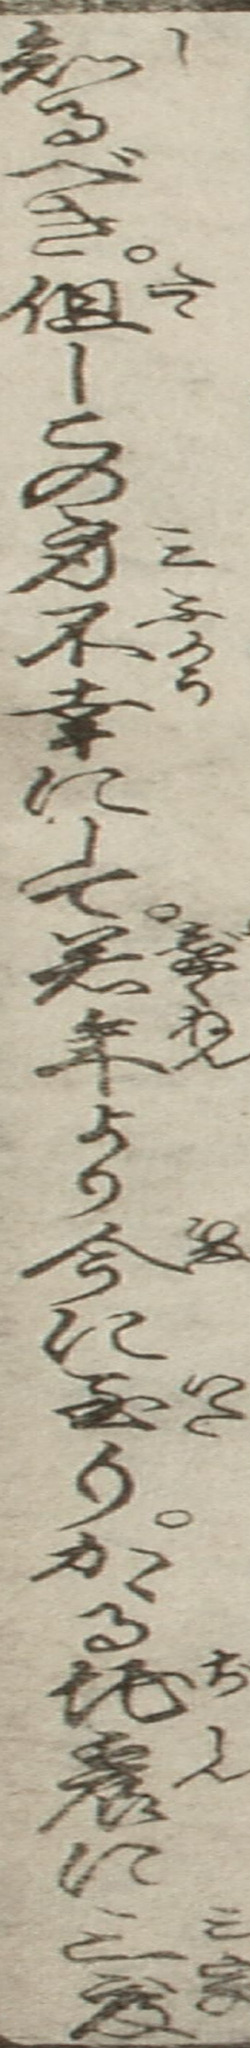知るべき。但しこの身不幸にして。若年より今に至り。かゝる地震に三度

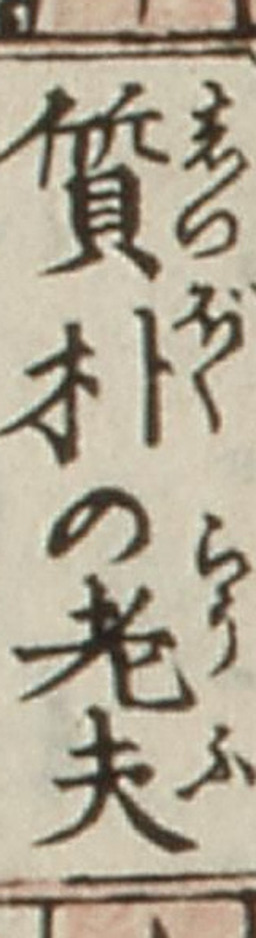質朴の老夫
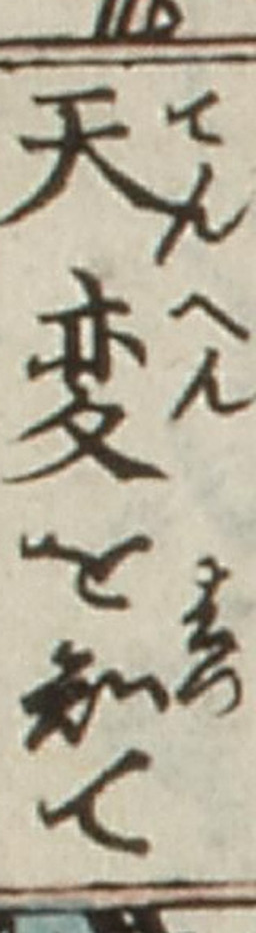天変を知て
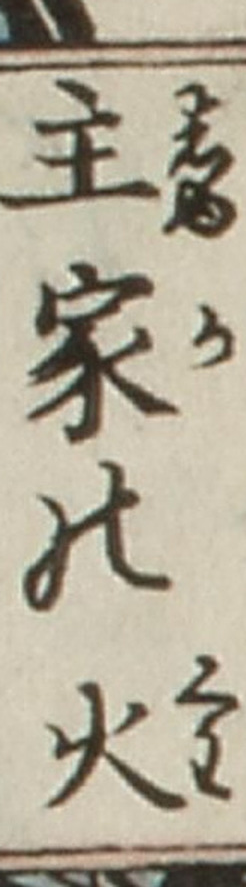主家の火

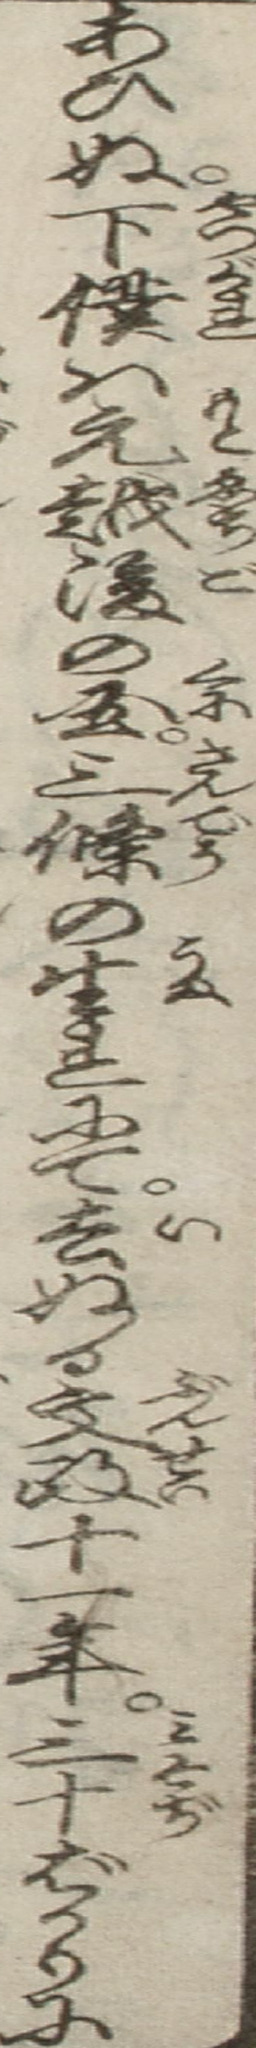あひぬ。下僕は元越後の国。三條の生れにて。去ぬる文政十一年三十ばかりに
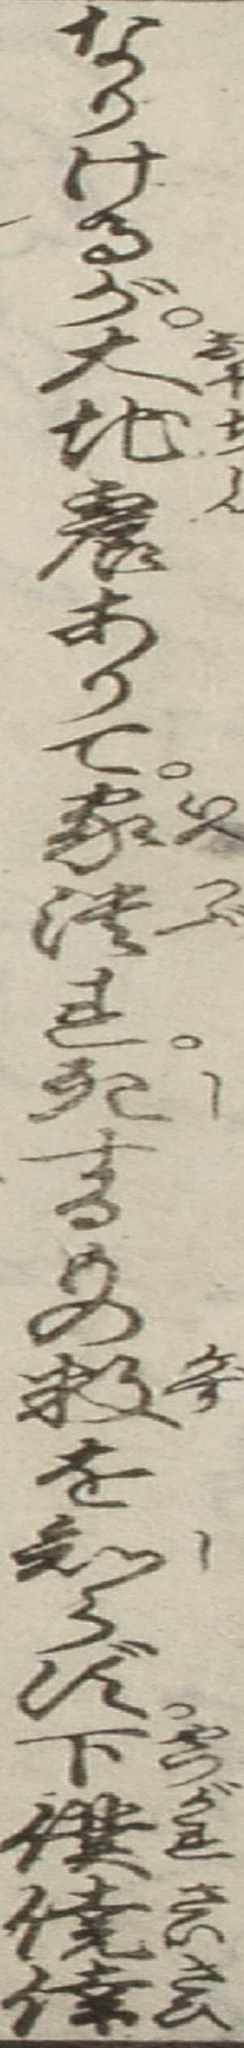なりけるが。大地震ありて。家潰れ。死するもの数をしらず。下僕僥倖
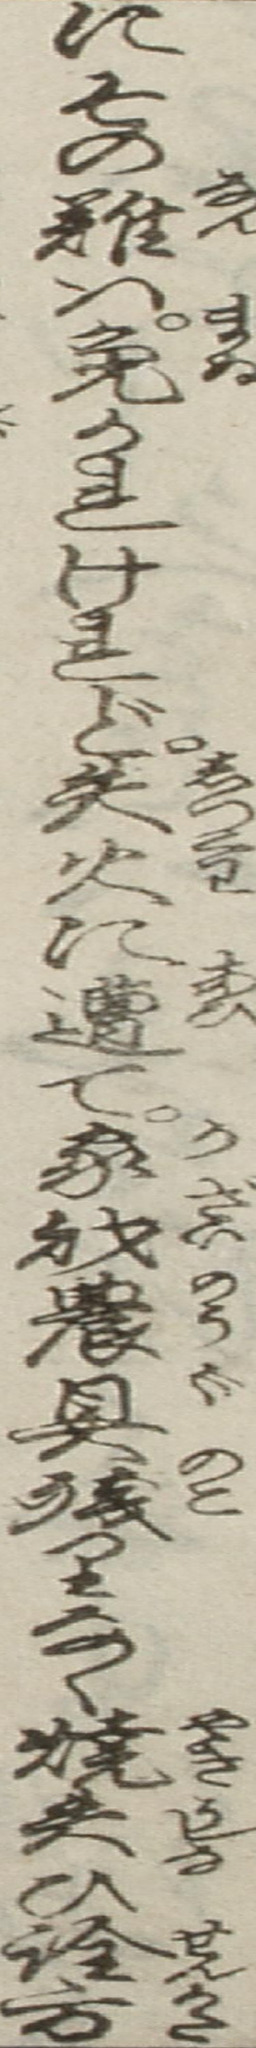にその難は。免かれけれど。失火に遭て。家財農具残りなく焼失ひ詮方
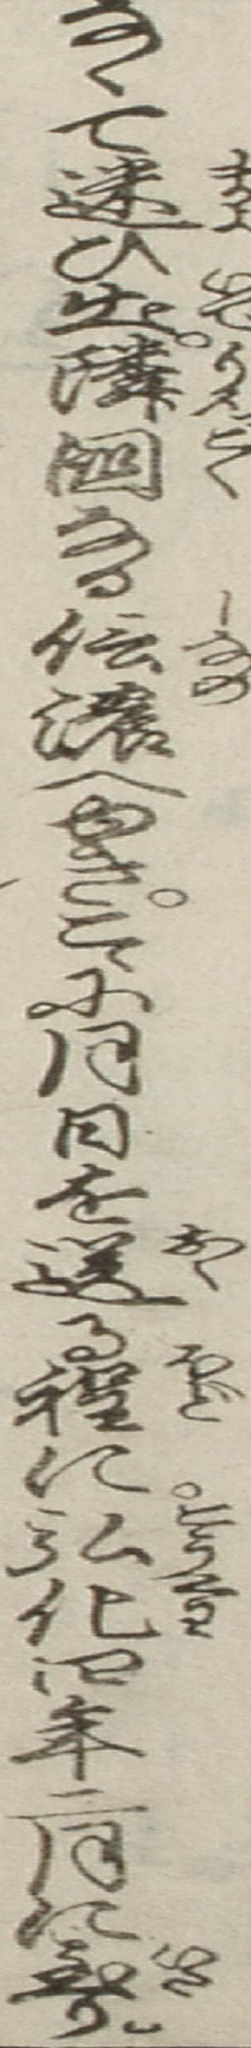なくて迷い出。隣国なる信濃へゆき。こゝに月日を送る程に。弘化四年二月に至り。
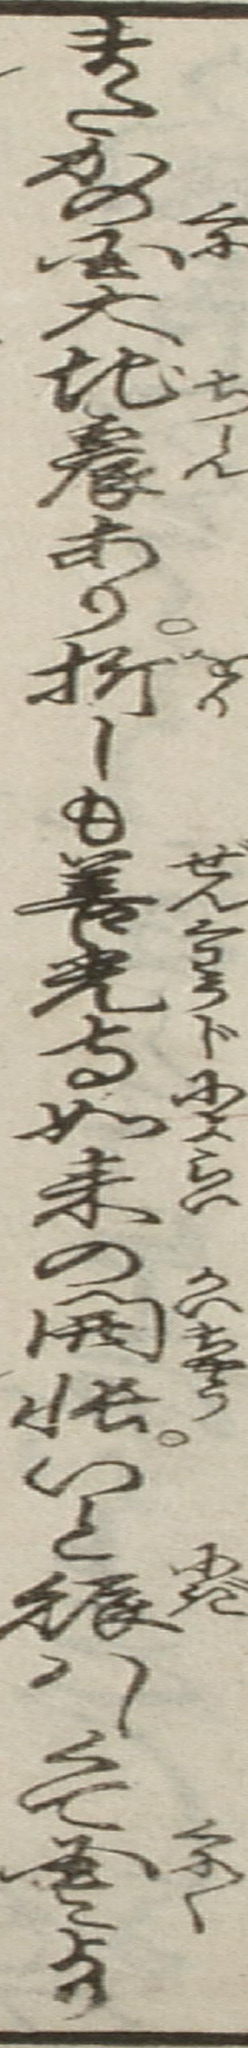またかの国大地震あり。折しも善光寺如来の開帳。いと賑はしくて国々より
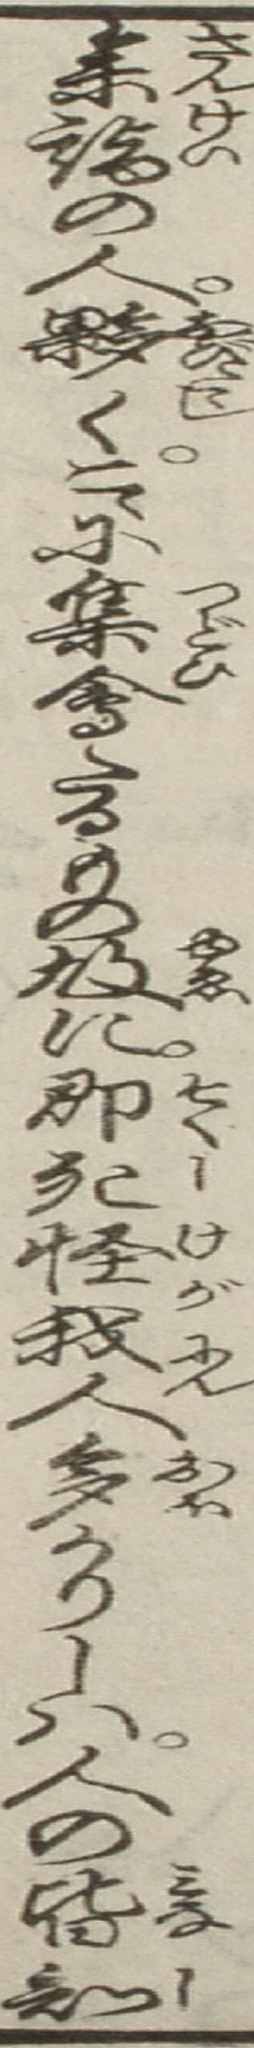参詣の人。夥く。こゝに集会たるもの故に。即死怪我人多かりしは。人の皆知
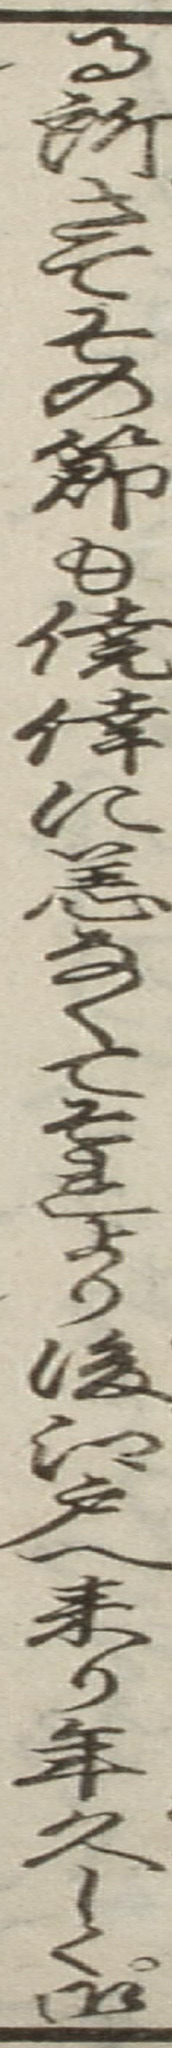る所。さてその節も僥倖に。恙なくてそれより後。江戸へ来り年久しく。御
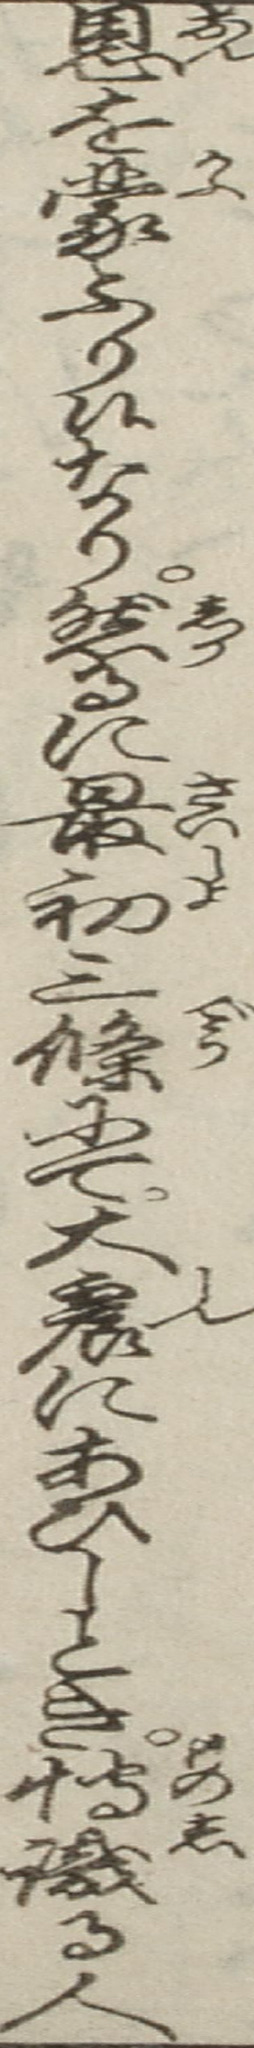恩を蒙ふり候なり。然るに最初三條にて。大震にあひしとき博識る人
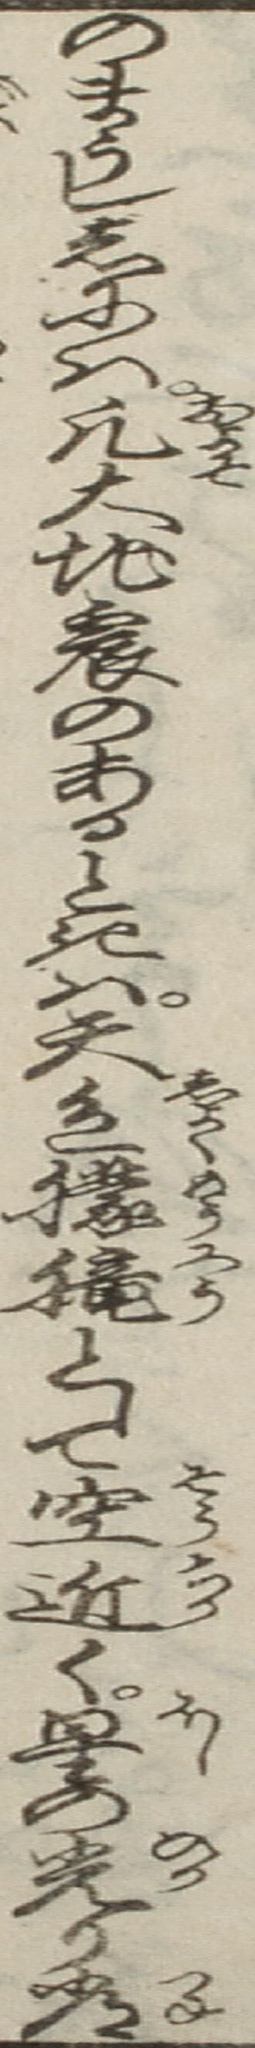のまうししには。凡大地震のあるときは。天色朦朧として空近く。星の光り常
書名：安政見聞録　上
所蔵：東京大学地震研究所図書室 Earthquake Research Institute Library, The University of Tokyo, JAPAN
